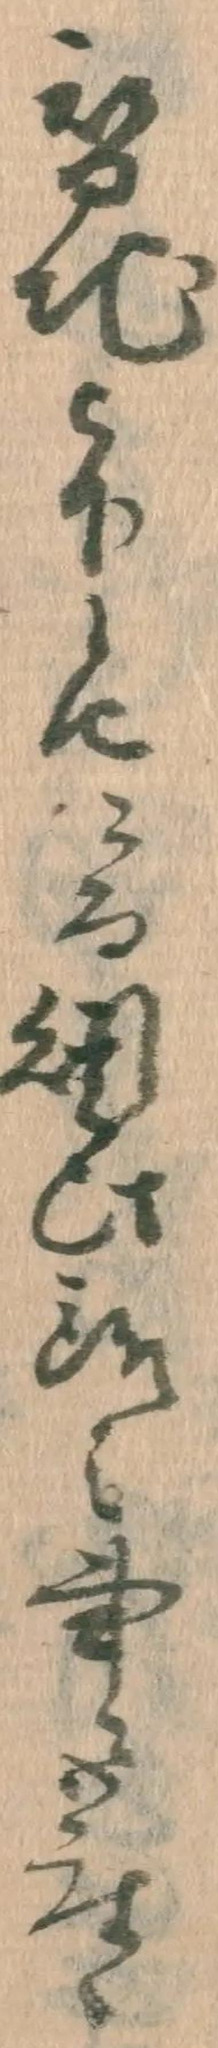替地被下候由ニ而此所之事ニ御座候
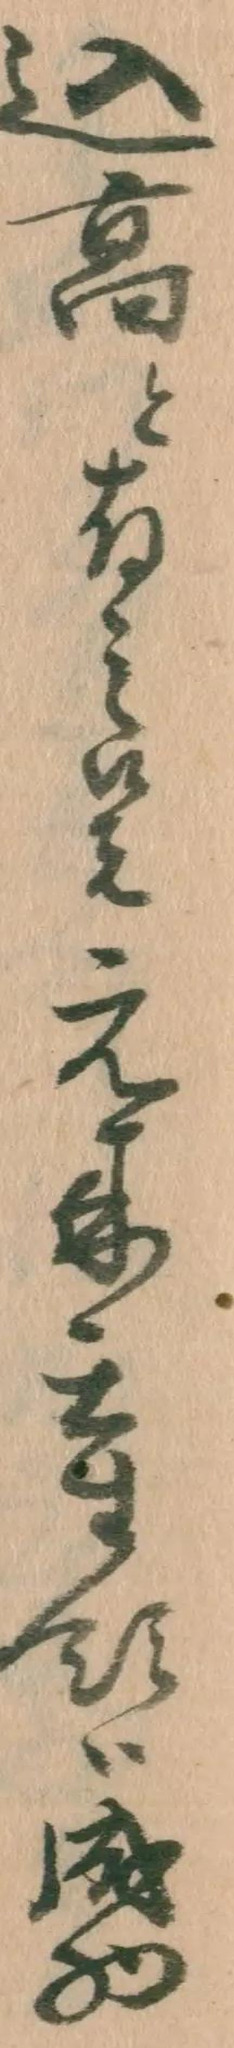込高と有之候者元来壬生領ハ成物
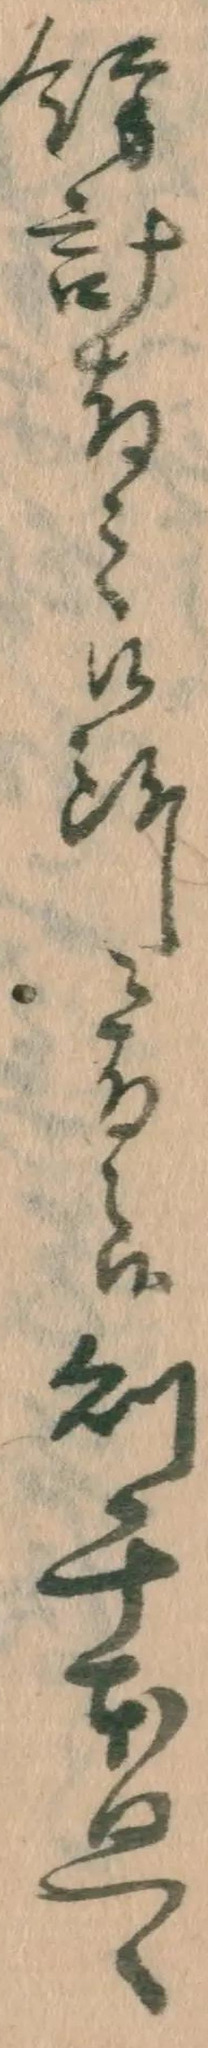余計有之候所ニ有之候則千本廻へ
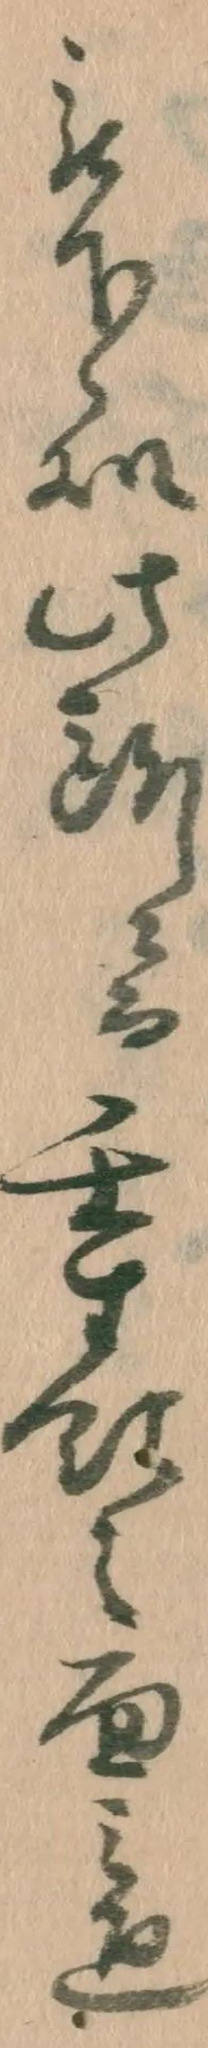被下候処此所ニ而壬生領之面之通
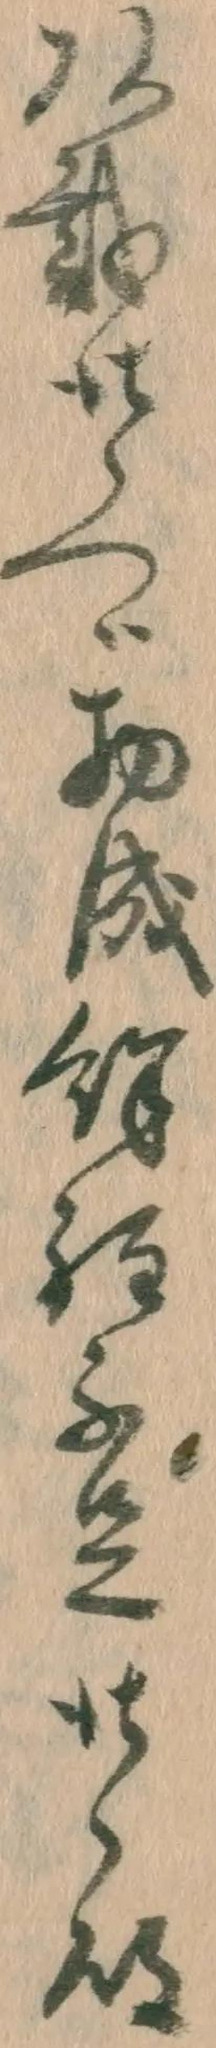頂戴仕候へハ物成余程不足仕候故
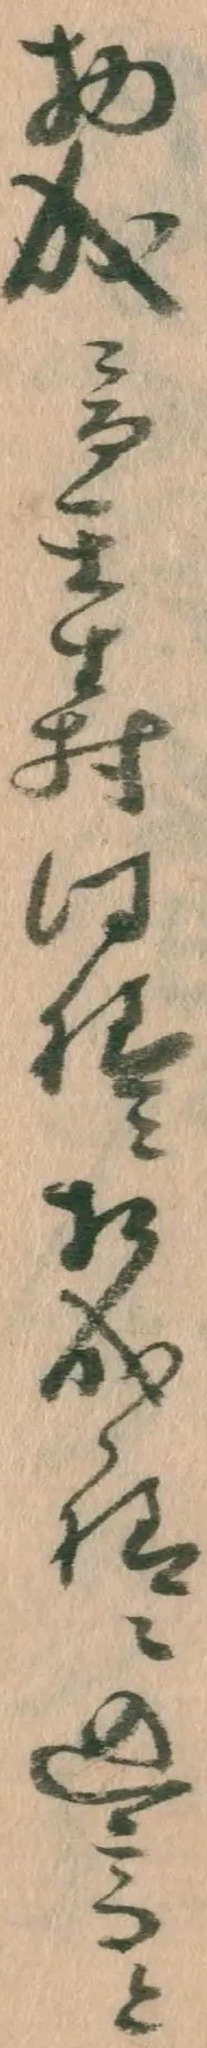物成ニ而壬生村同様ニ相成候様ニ込高と
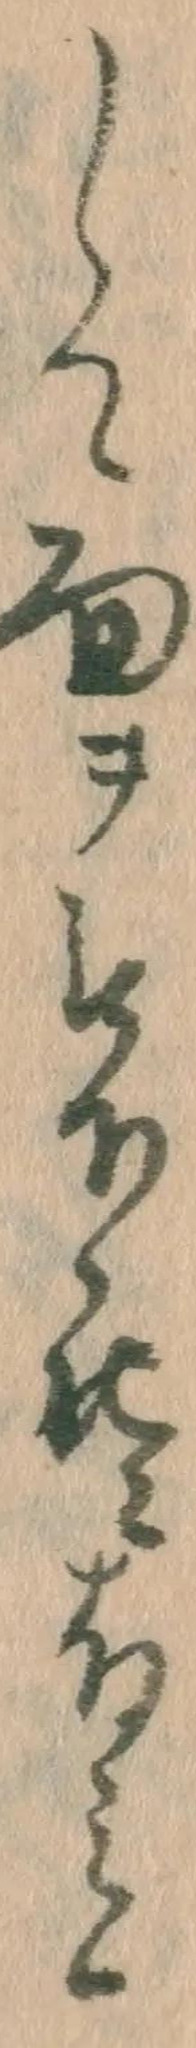して面ヲ被下候由ニ有之下候
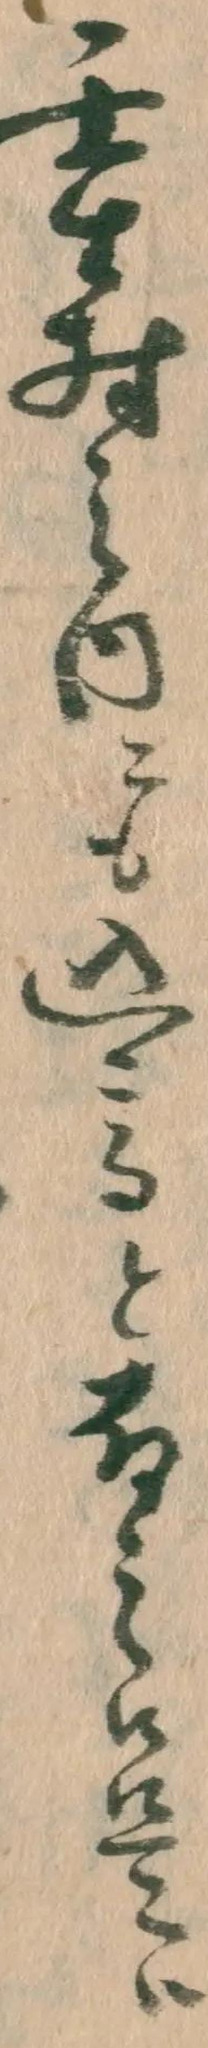壬生村之内ニも込高と有之候是ハ
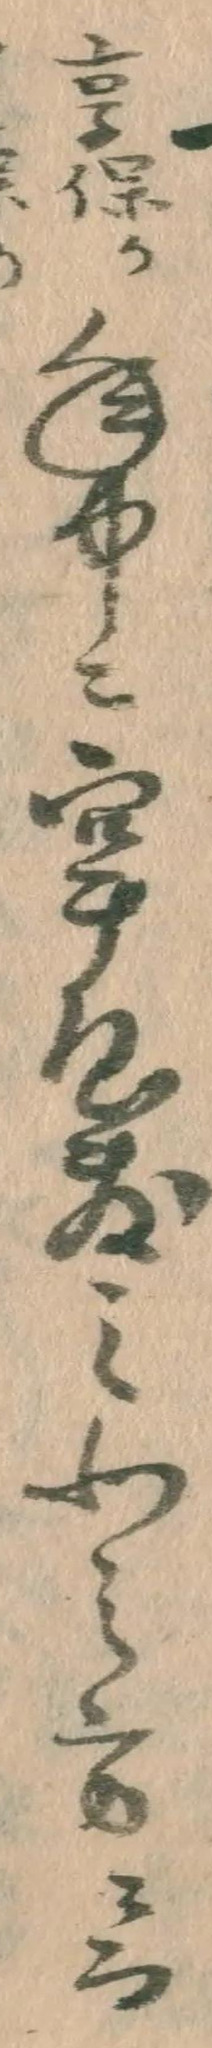寛保か年中ニ牢屋敷之北之方ニ而
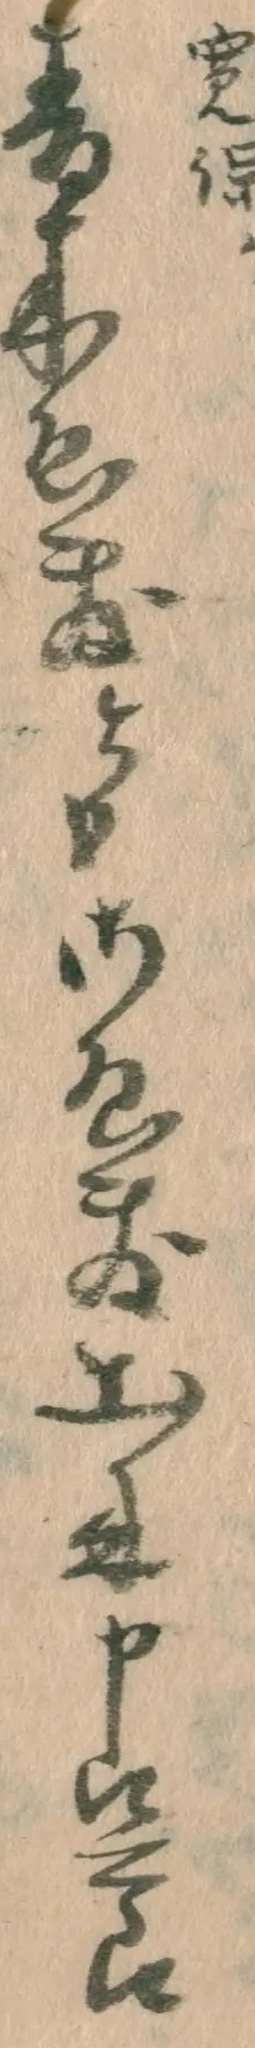番木屋敷と申御屋敷出来申候節
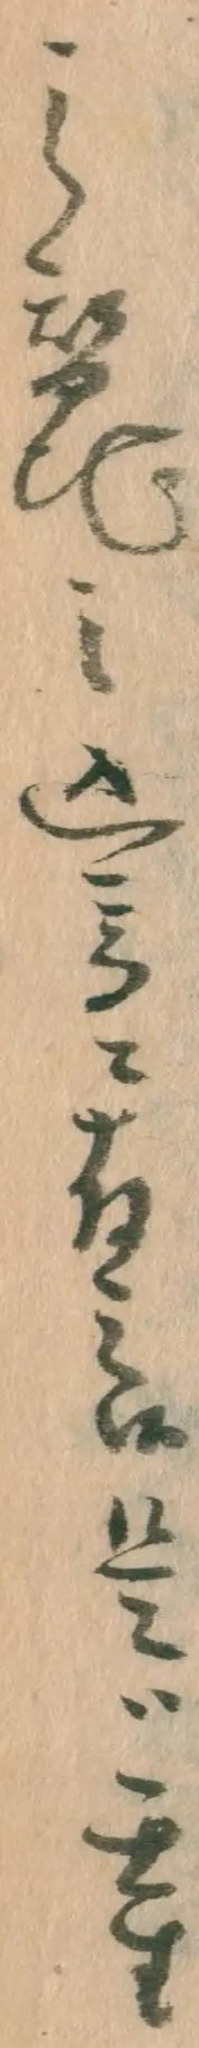之替地之込高ニ有之候是ハ壬生

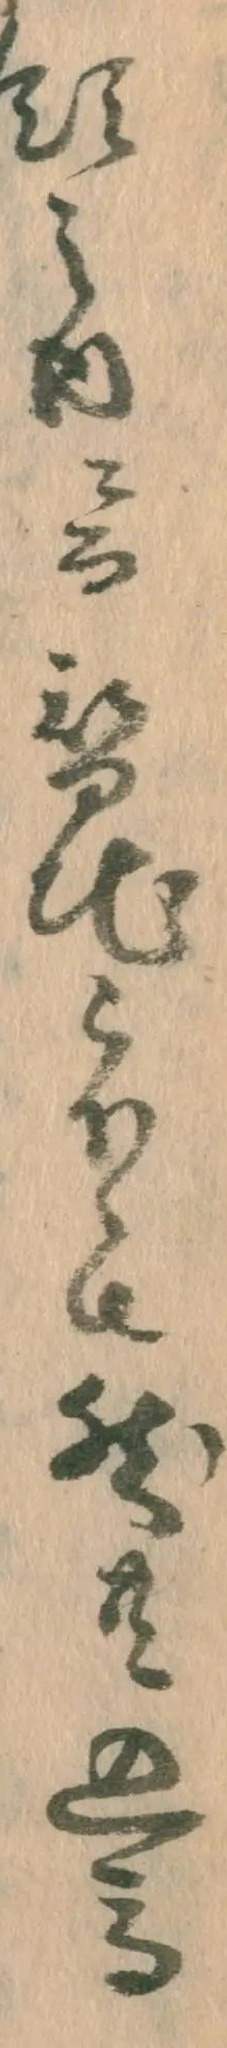領之内ニ而替地被下候由然共込高
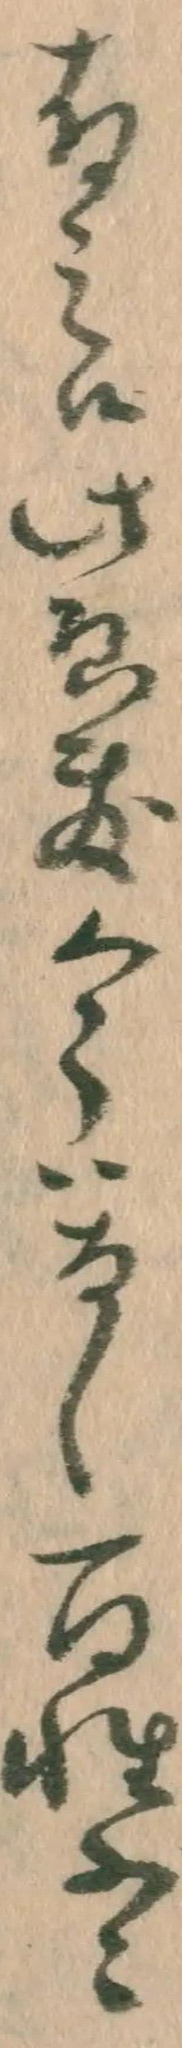有之候此屋敷今ハなし百性少々
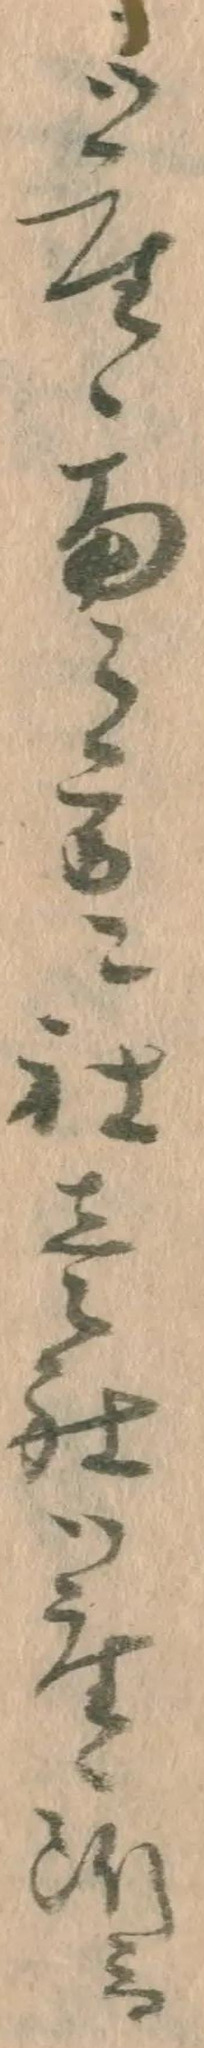御座候南之方ニ社壱社御座候所ニ而
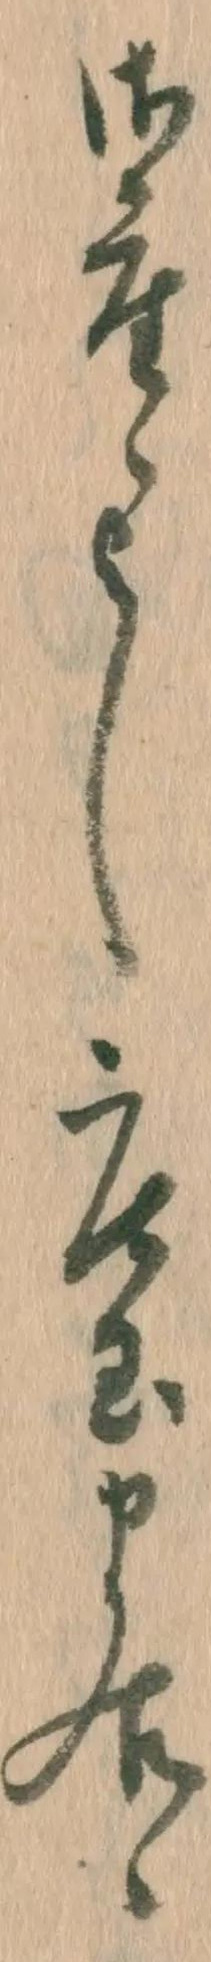御座候よし庄屋申居候
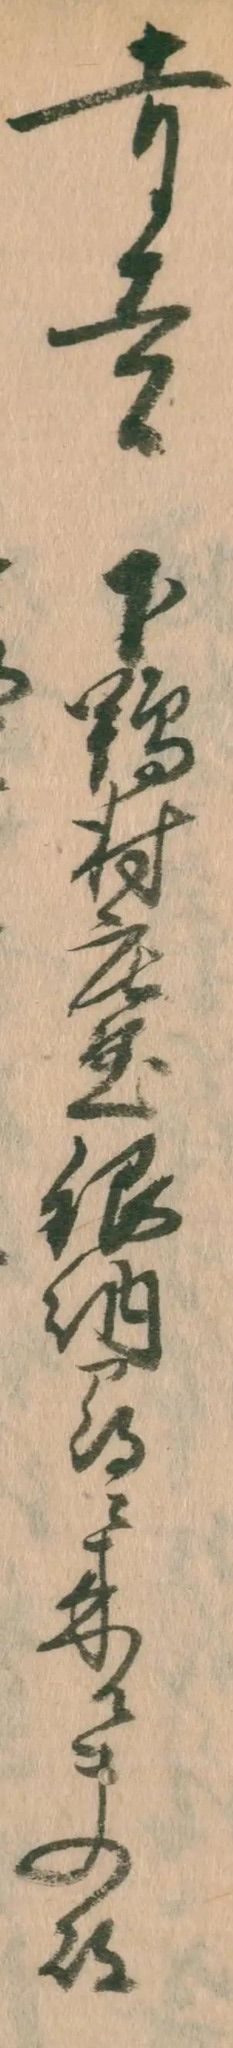十一月十一日下鶴村庄屋銀納尋ニ来ル夫故
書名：賀茂社記録. 第61冊
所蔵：国立国会図書館 National Diet Library, JAPAN
